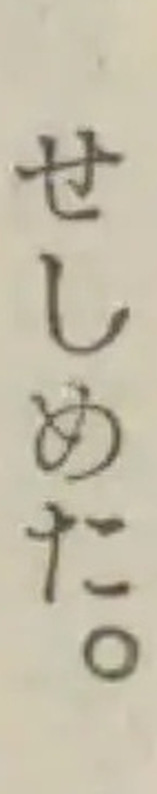せしめた。
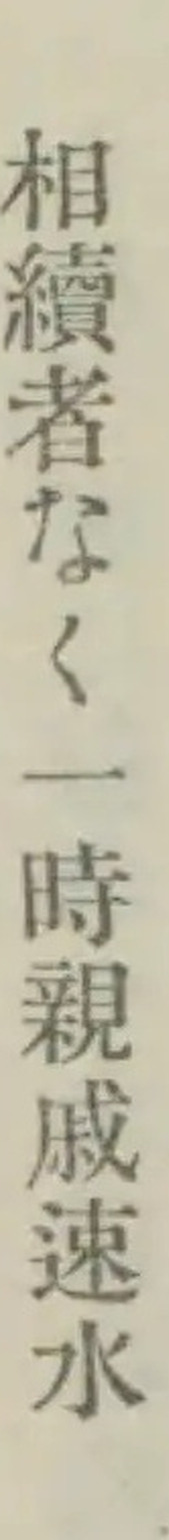相続者なく一時親戚速水
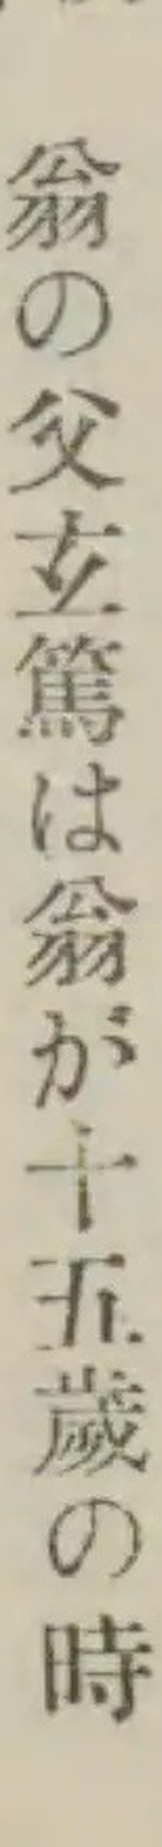翁の父玄篤は翁が十五歳の時
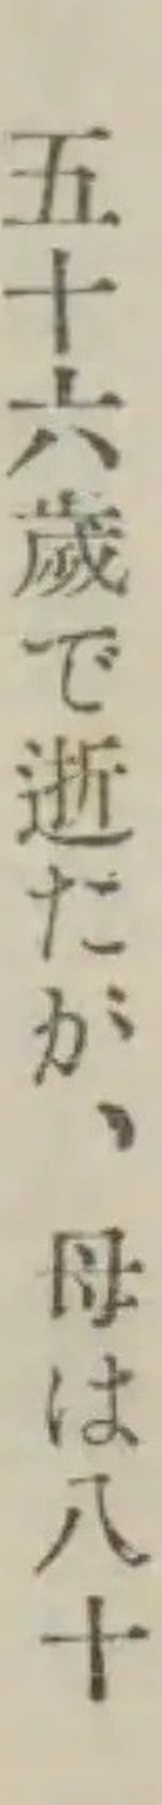五十六歳で逝たが、母は八十
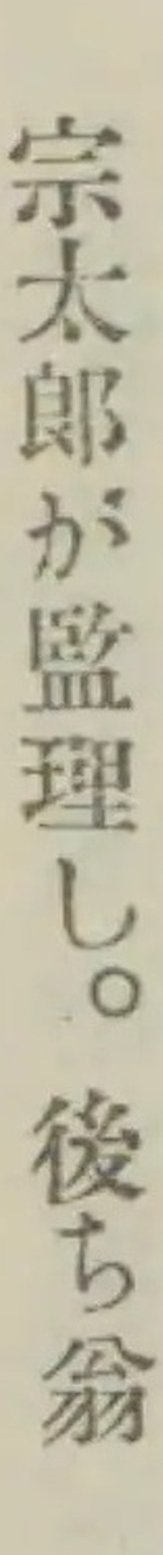宗太郎が管理し。後ち翁
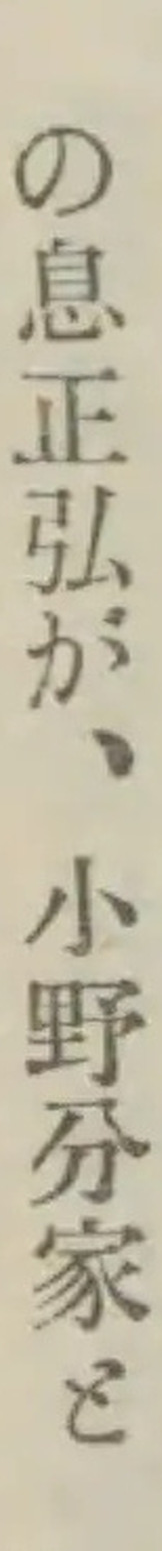の息正弘が、小野分家と
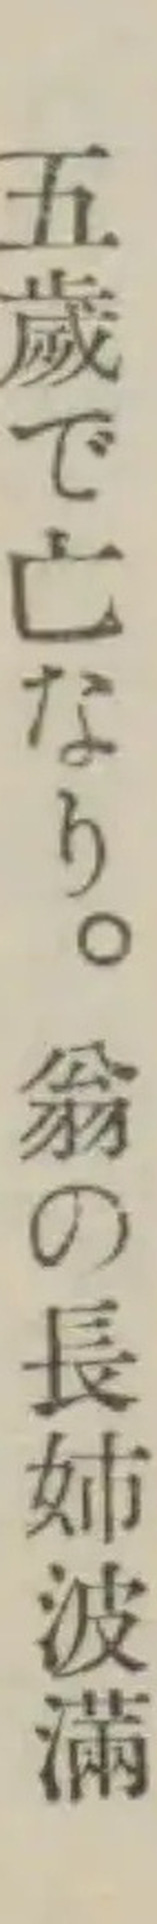五歳で亡なり。翁の長姉波満
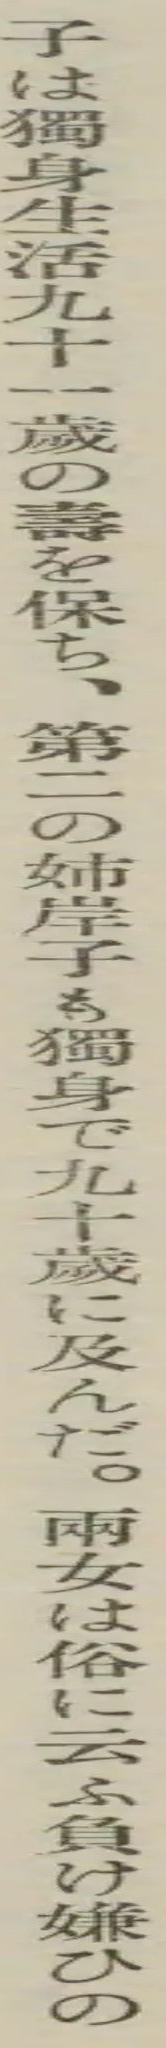子は独身生活九十一歳の寿を保ち、第二の姉岸子も独身で九十歳に及んだ。両女は俗に云ふ負け嫌ひの
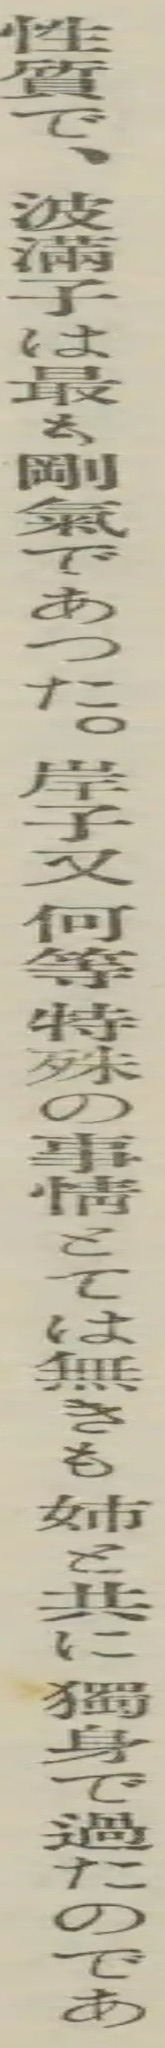性質で、波満子は最も剛気であつた。岸子又何等特殊の事情とては無きも姉と共に独身で過たのであ
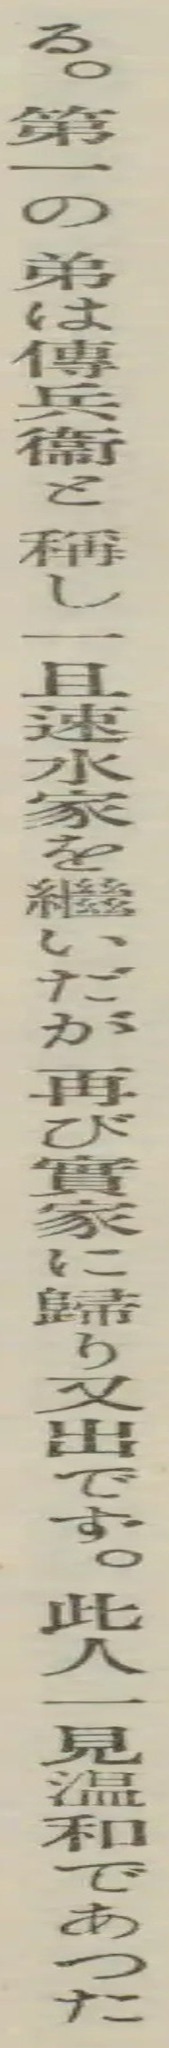る。第一の弟は傳兵衛と称し一旦速水家を継いだが再び実家に帰り又出でず。此人一見温和であつた
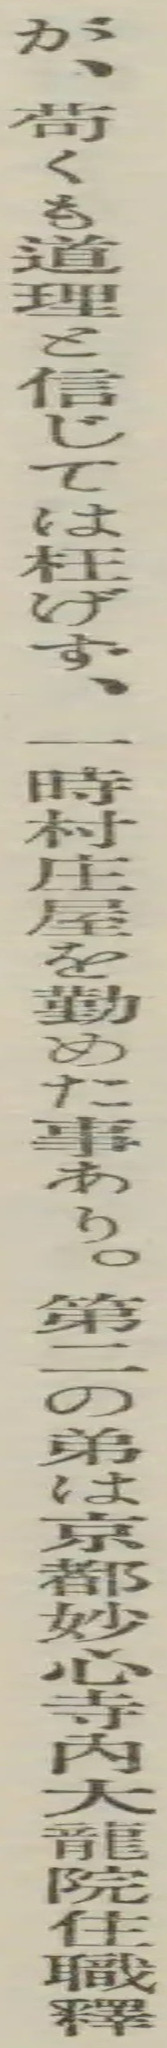が、苟くも道理と信じては枉げず、一時村庄屋を勤めた事あり。第二の弟は京都妙心寺内大龍院住職釋
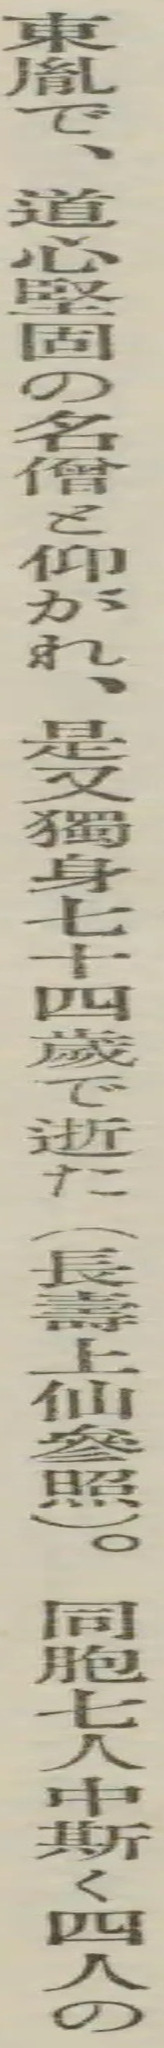東胤で、道心堅固の名僧と仰がれ、是又独身七十四歳で逝た(長寿上仙参照)。同胞七人中斯く四人の
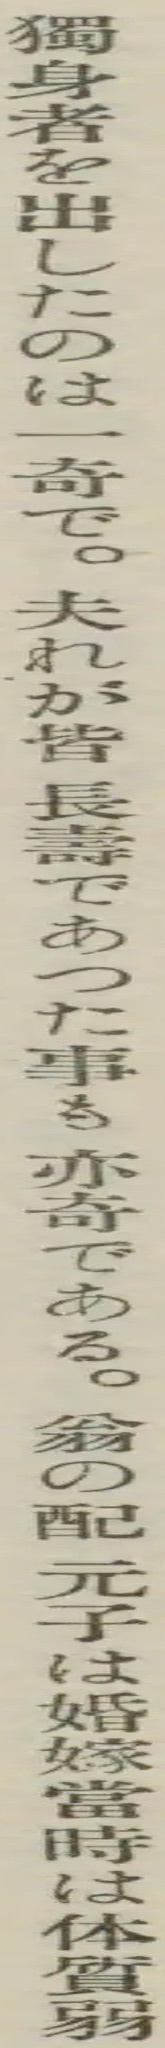独身者を出したのは一奇で。夫れが皆長寿であつた事も亦奇である。翁の配元子は婚嫁当時は体質弱
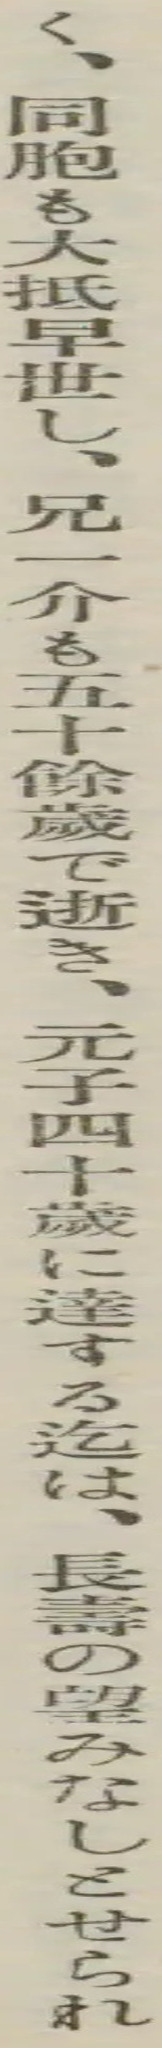く、同胞も大抵早世し、兄一介も五十余歳で逝き、元子四十歳に達する迄は、長寿の望みなしとせられ
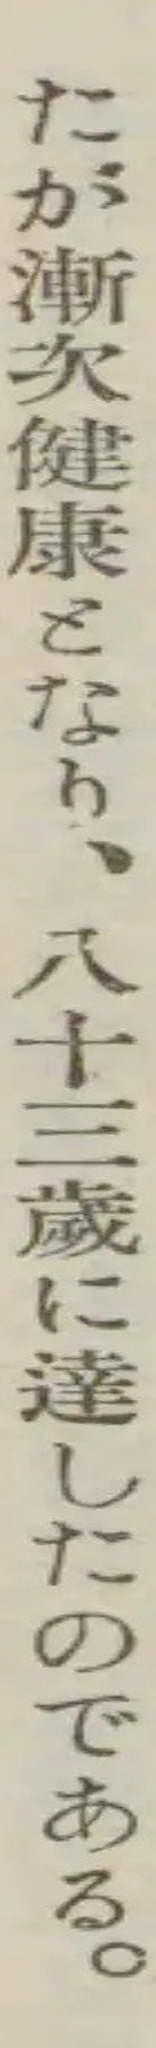たが漸次健康となり、八十三歳に達したのである。
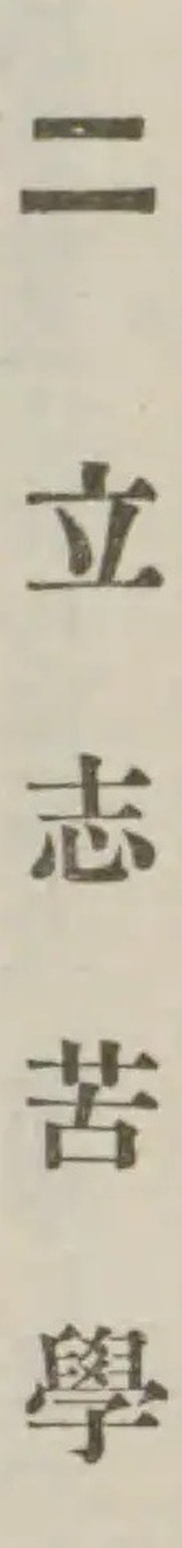二立志苦学
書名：小野湖山翁小伝
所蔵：国立国会図書館 National Diet Library, JAPAN
